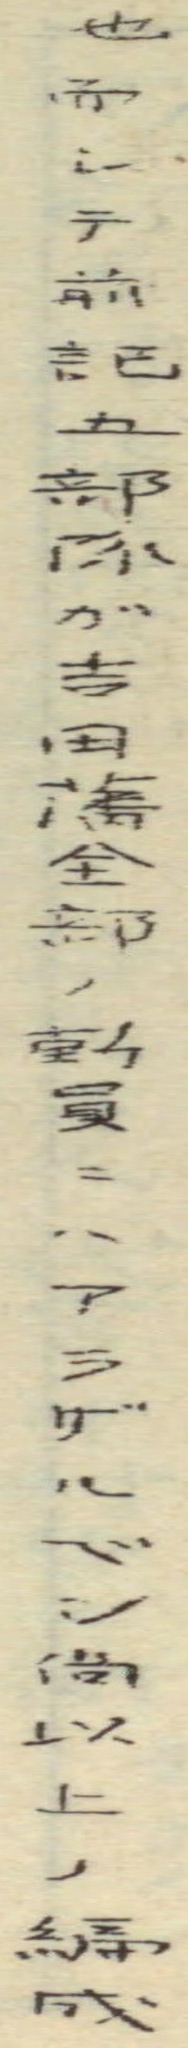也而シテ前記五部隊が吉田藩全部ノ動員二ハアラザㇽベシ尚以上ノ編成
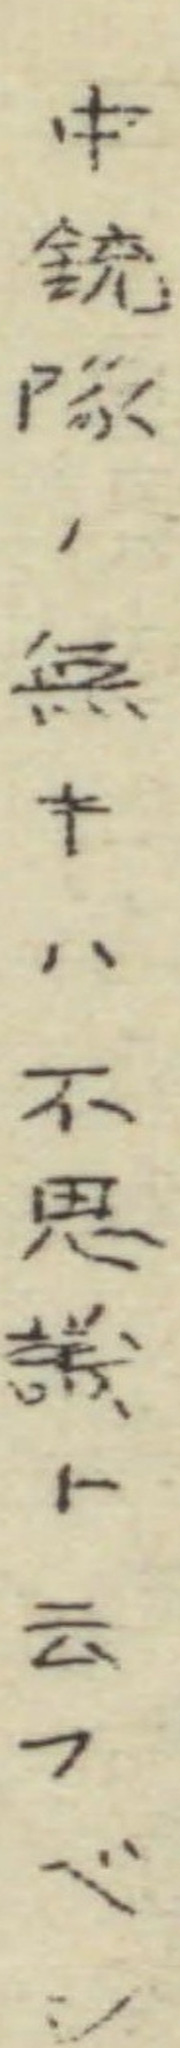中銃隊ノ無キハ不思議ト云フベシ
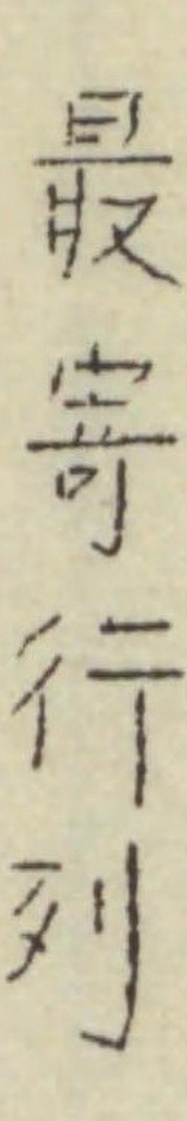最寄行列
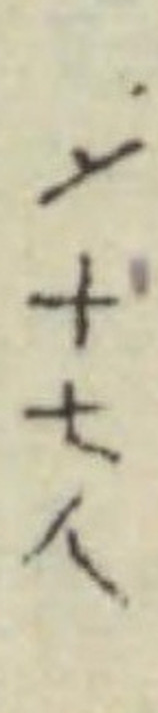〆十七人
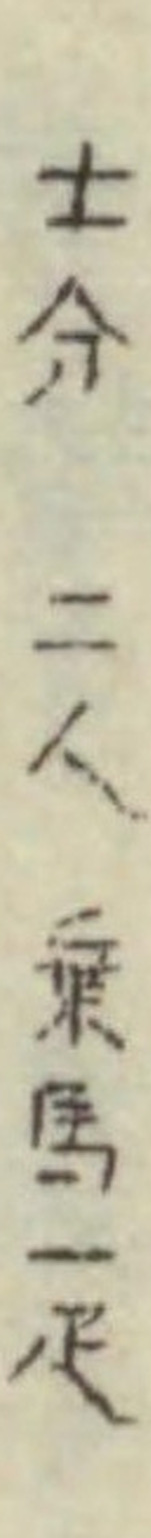士分二人乗馬一疋
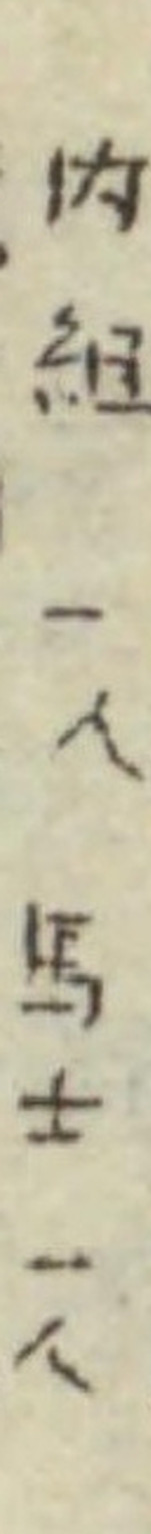内組一人馬士一人
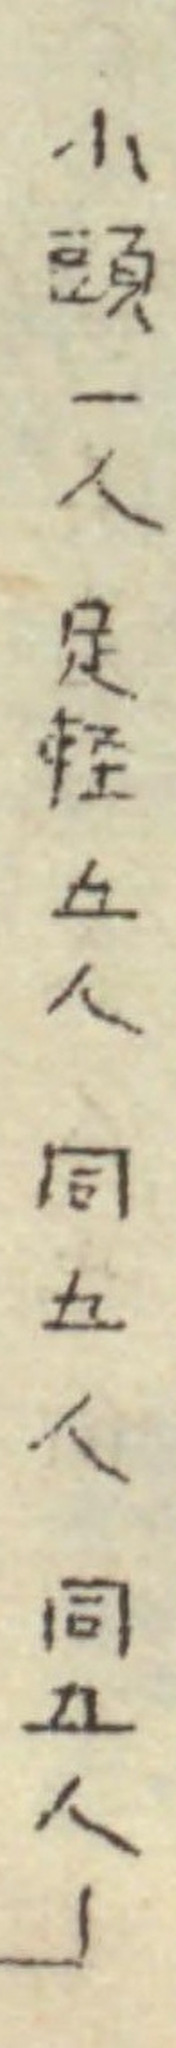小頭一人足軽五人同五人同五人
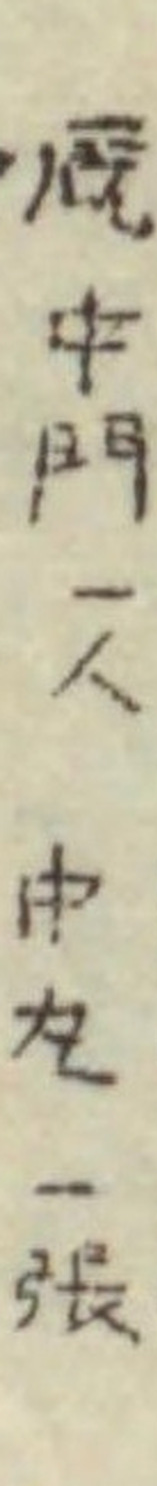厩中間一人中丸一張
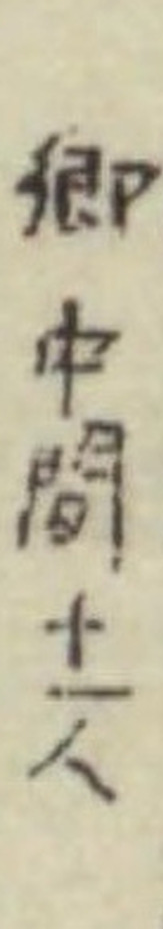御中間十一人
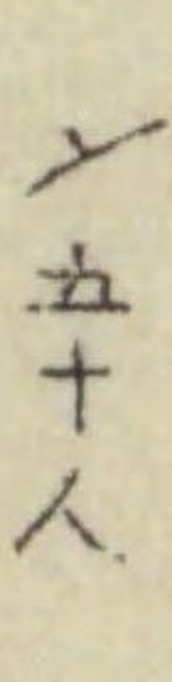〆五十人
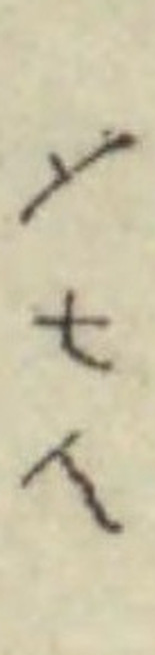〆七人
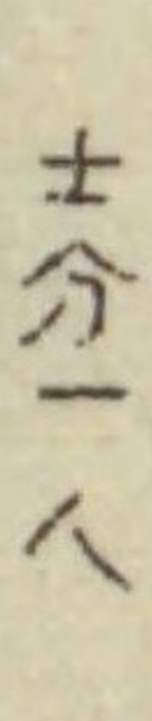士分一人
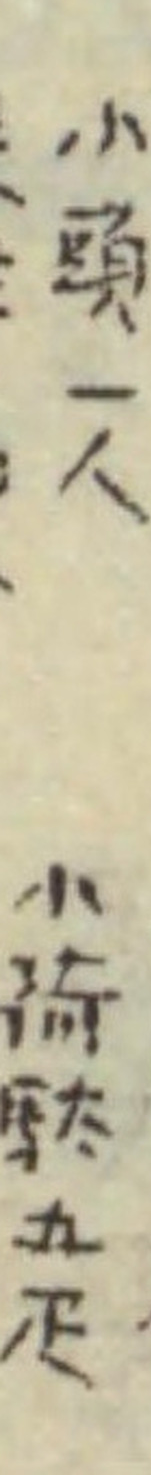小頭一人小荷駄五疋
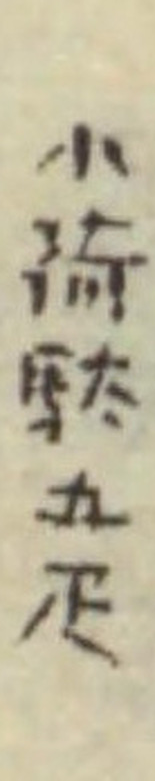小荷駄一疋
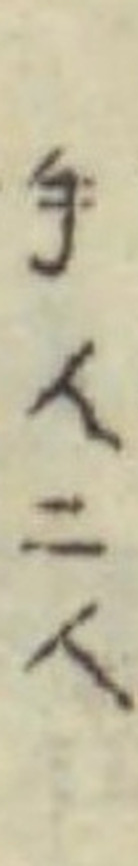手人二人
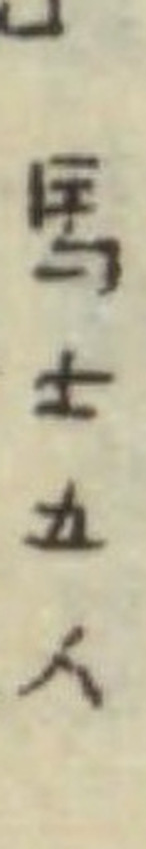馬士一人
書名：三河吉田藩動員史料
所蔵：国立国会図書館 National Diet Library, JAPAN
